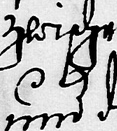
5364.
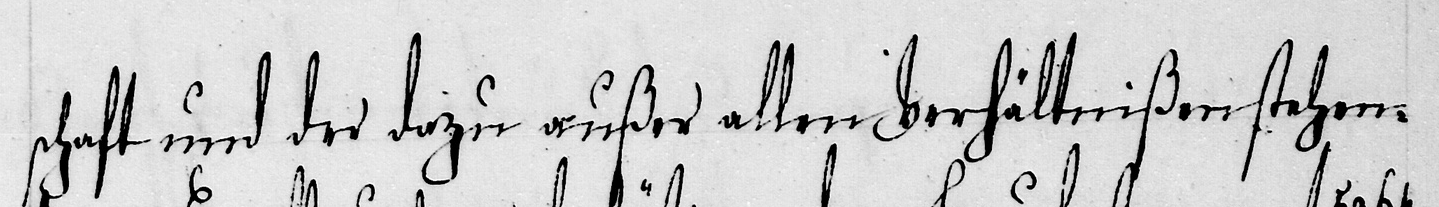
schaft und der dazu außer allen Verhältnißen stehen¬
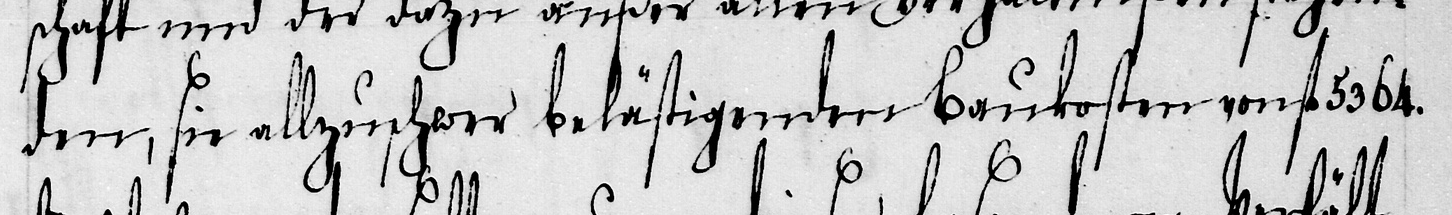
den, sie allzuschwer belästigenden Baukosten von fl.
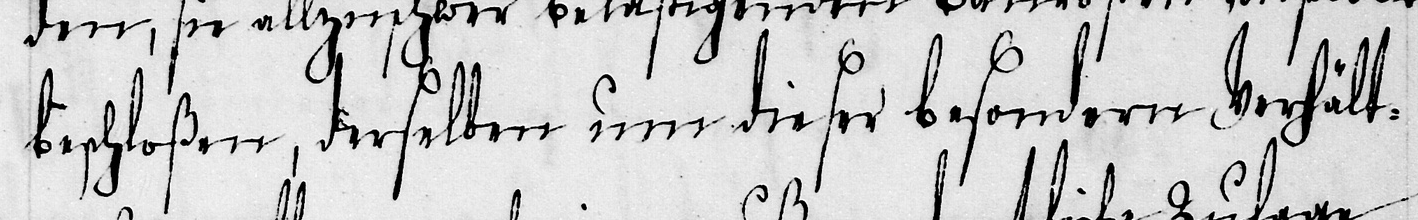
beschloßen, derselben um dieser besondern Verhält¬
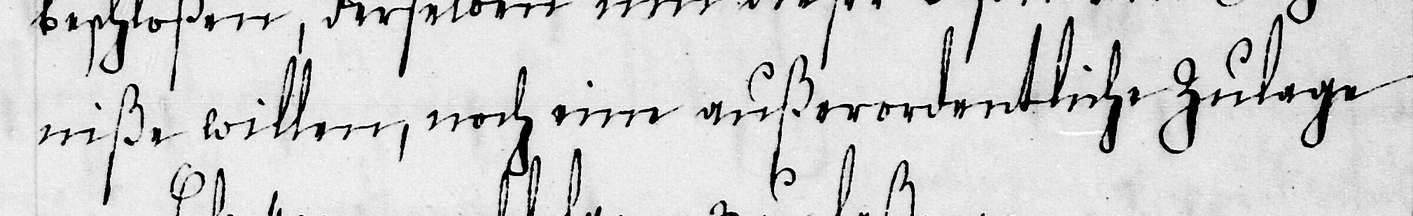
niße willen, noch eine außerordentliche Zulage
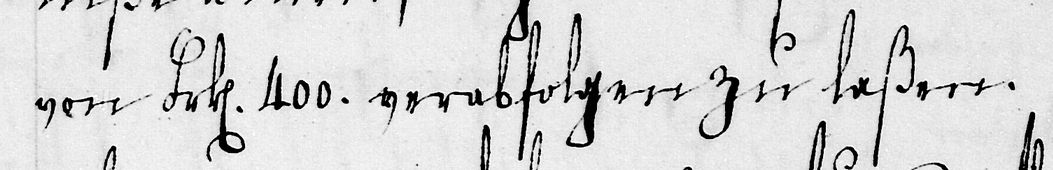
von Frk[en]. 400. verabfolgen zu laßen.
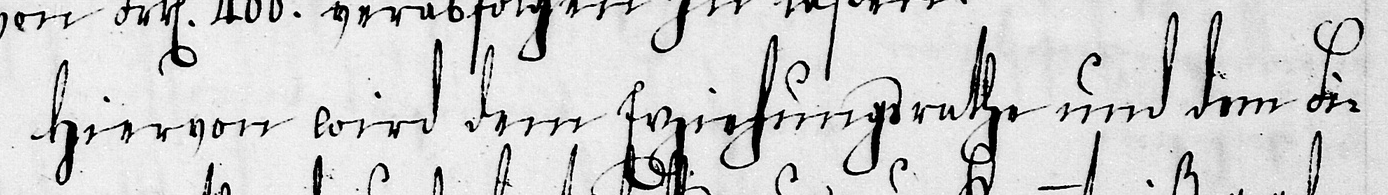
Hiervon wird dem Erziehungsrathe und dem Fi¬
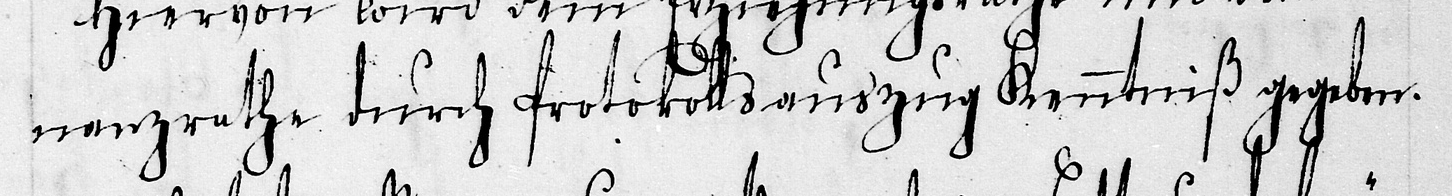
nanzrathe durch Protokollsauszug Kenntniß gegeben.
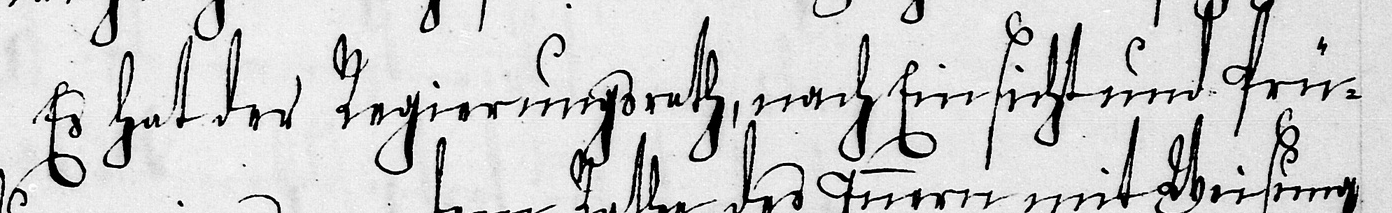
Es hat der Regierungsrath, nach Einsicht und Prü¬
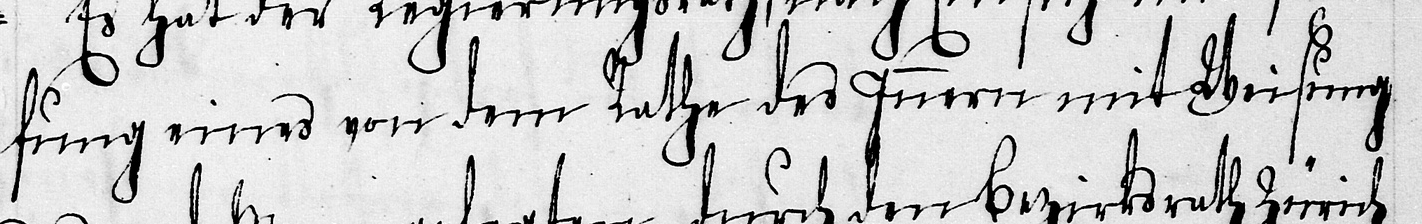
fung eines von dem Rathe des Innern mit Weisung
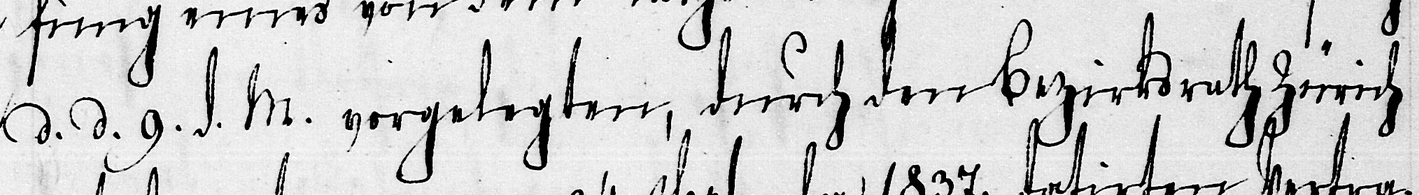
d. d. 9. d. M. vorgelegten, durch den Bezirksrath Zürich
